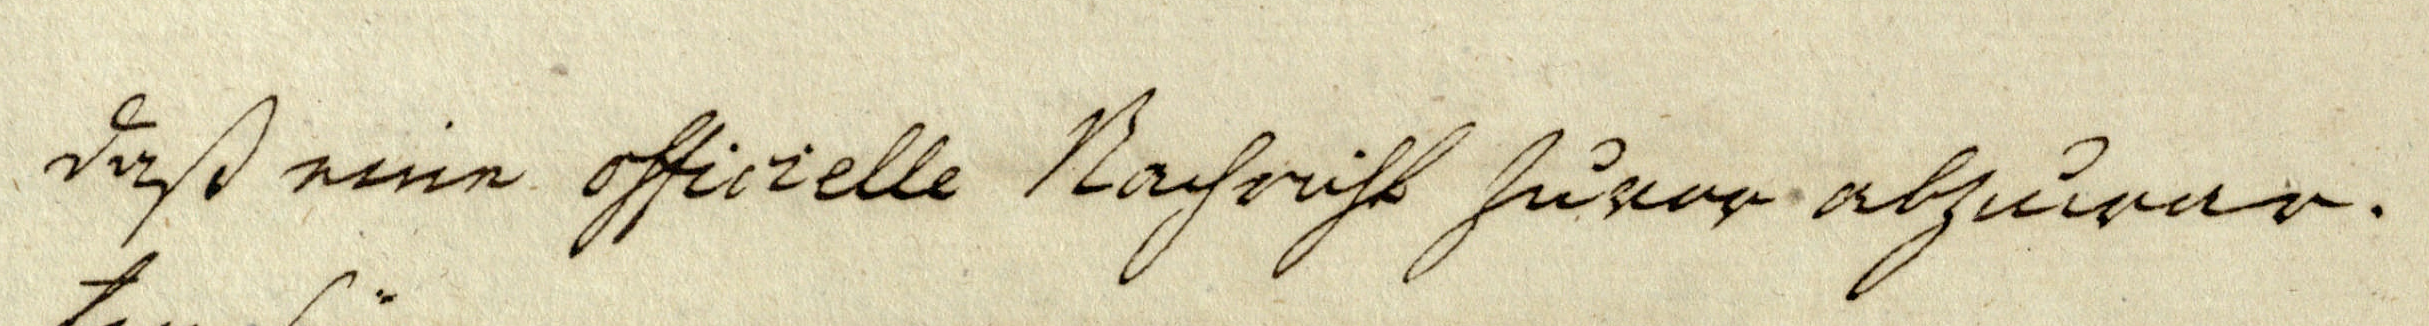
daß eine otficelle Nachricht zuvor abzuwar¬
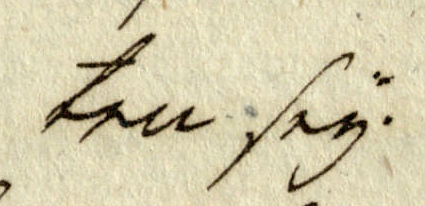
ten seÿ.
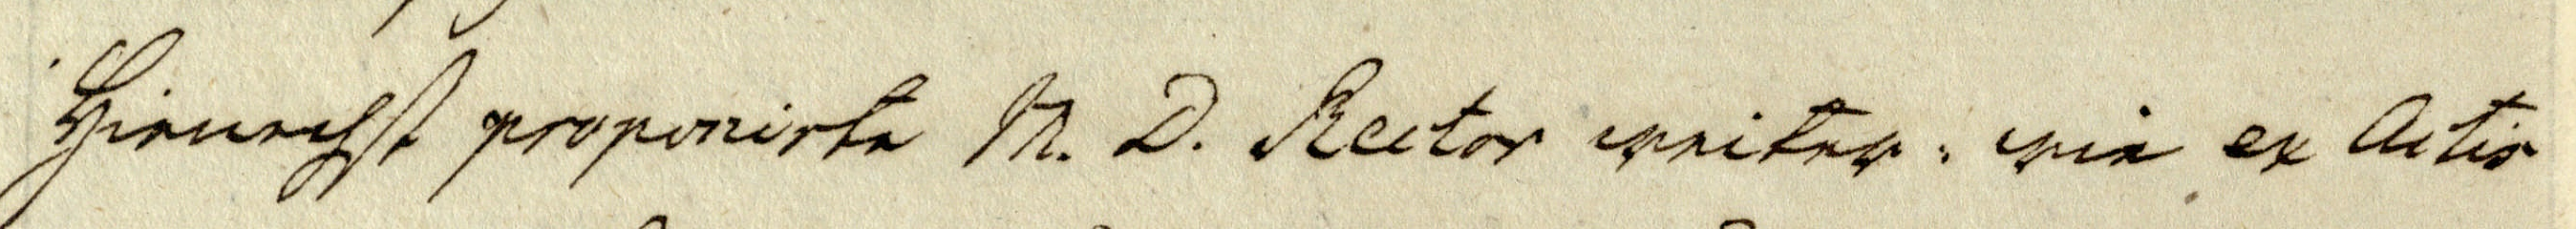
Hienechst proponirte M. D. Rector weiter: wie ex Actis
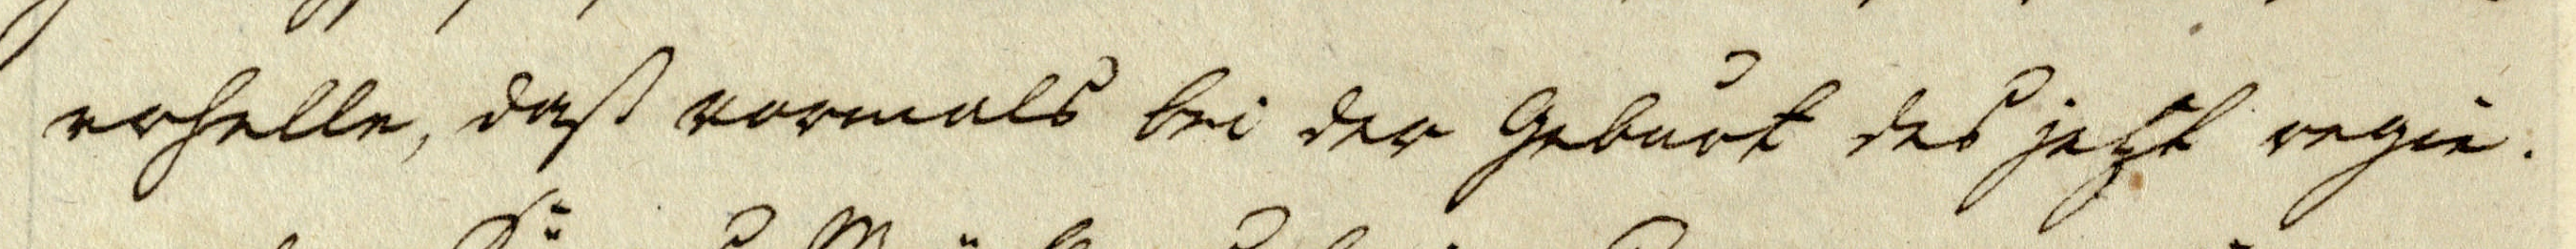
erhelle, daß vormals bei der Geburt des jetzt regie¬
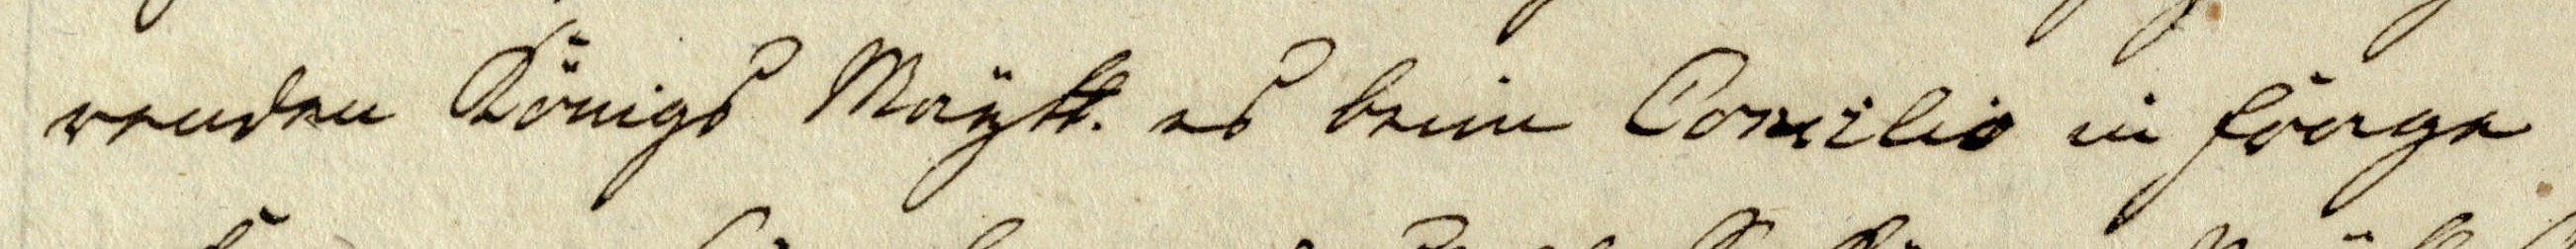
renden Königs Maÿtt. es beim Concilio in Frage
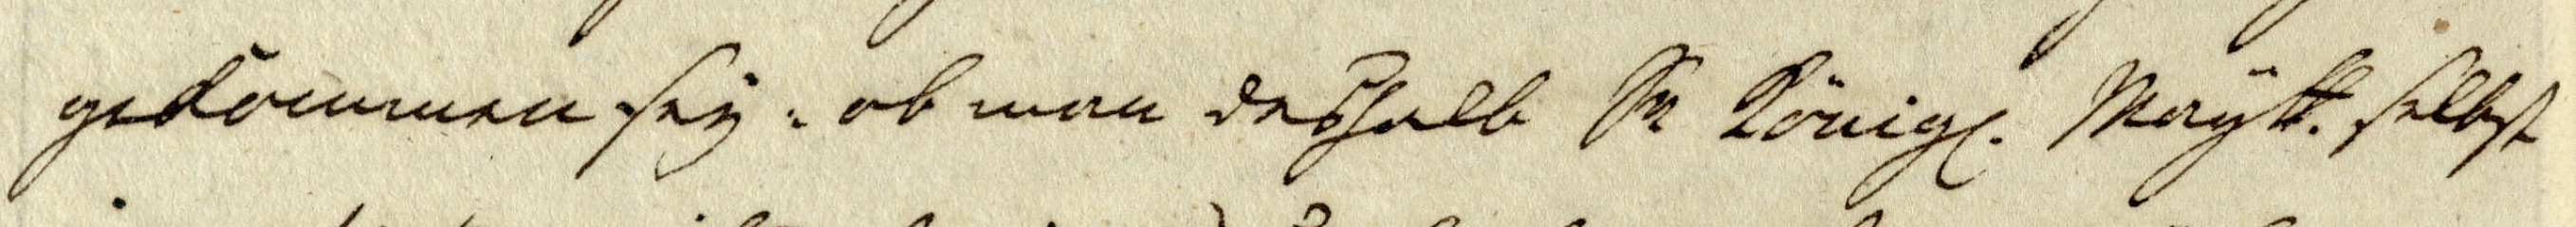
gekommen seÿ: ob man deshalb Sr Königl. Maÿtt. selbst
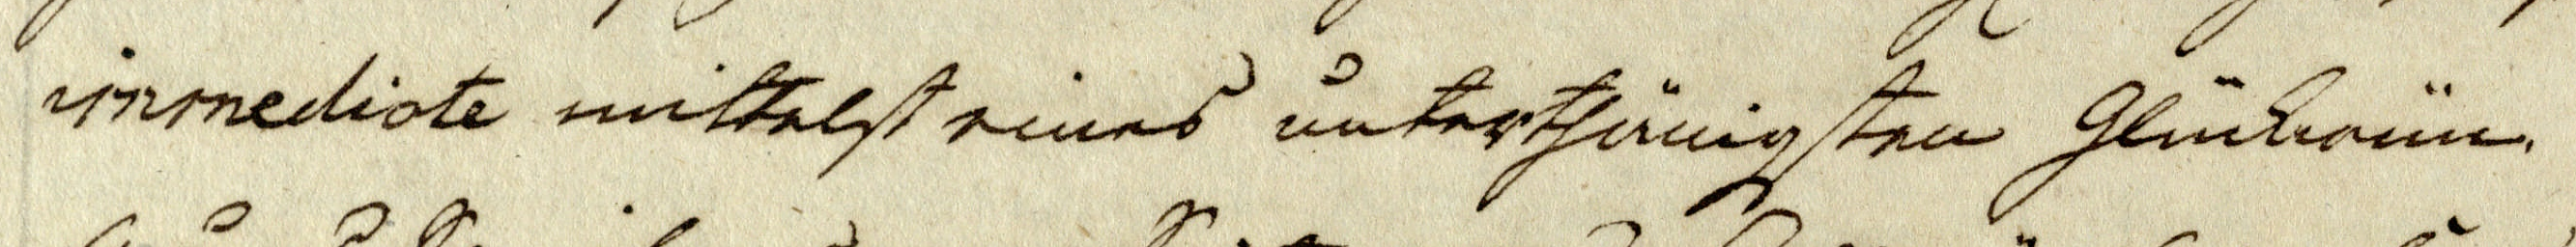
immediate mittelst eines unterthänigsten Glückwün¬
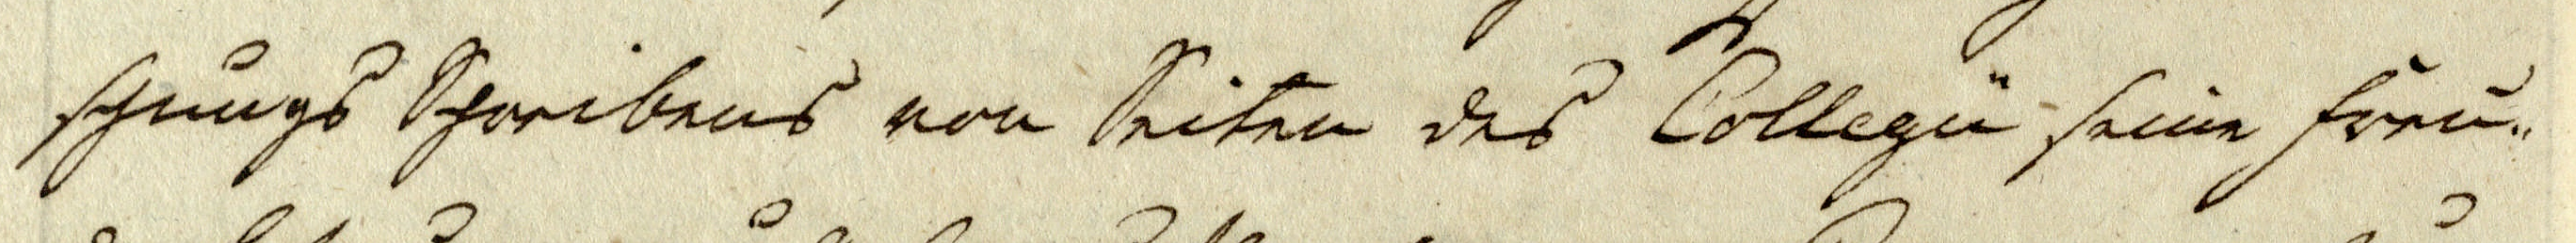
schungs Schreibens von Seiten des Collegii seine Freu¬
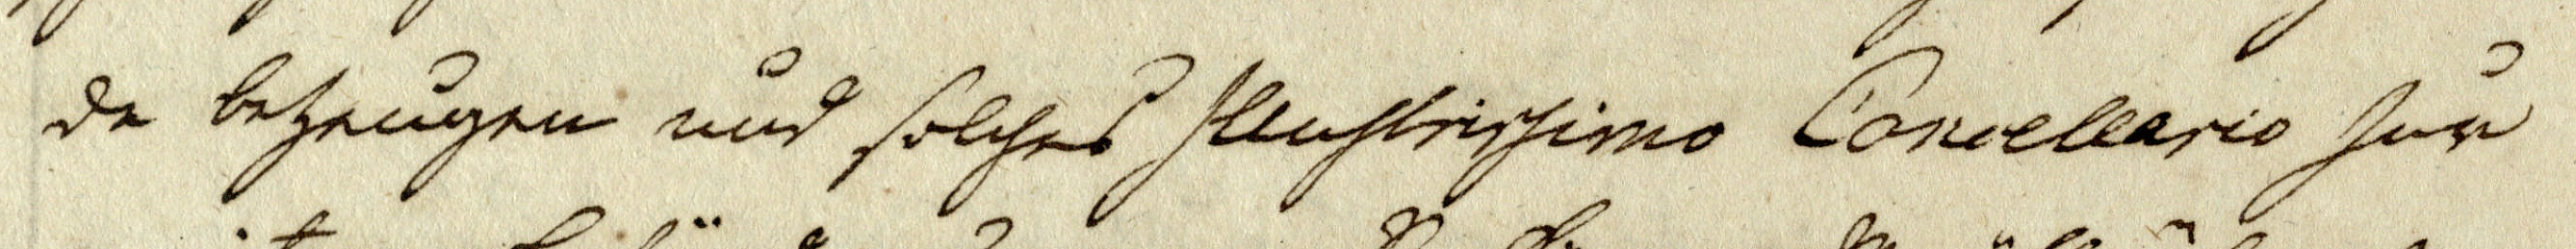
de bezeugen und solches Illustrissimo Cancellario zur
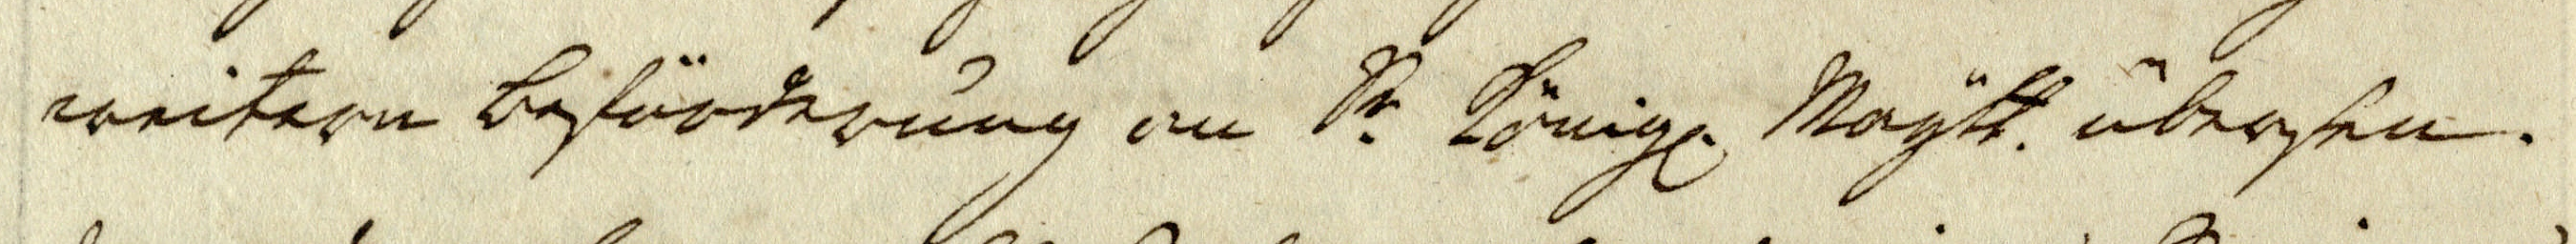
weitern Beförderung an Sr. Königl. Maÿtt. übersen¬
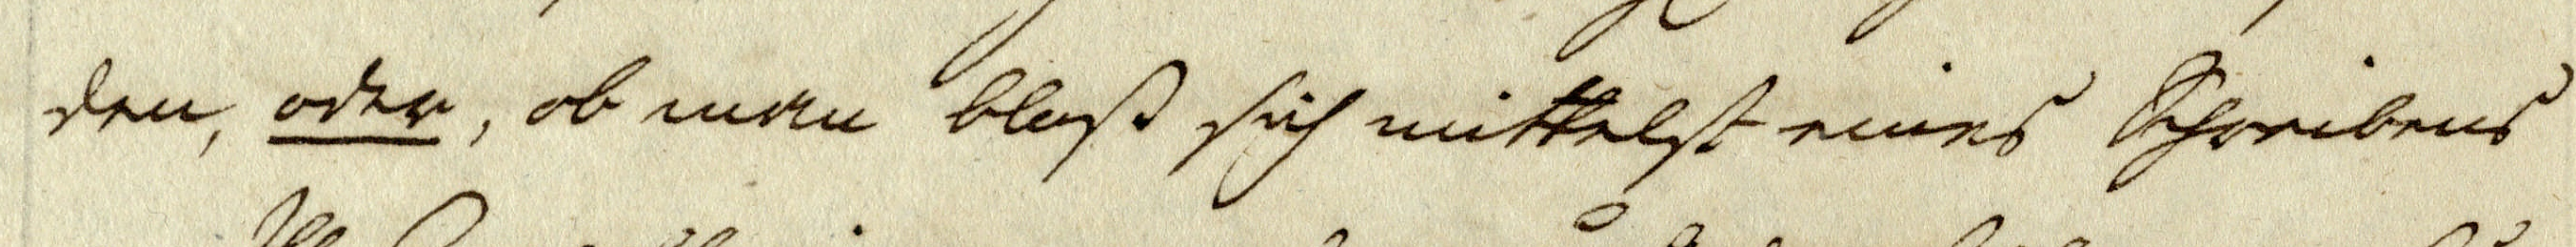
den, oder, ob man bloß sich mittelst eines Schreibens
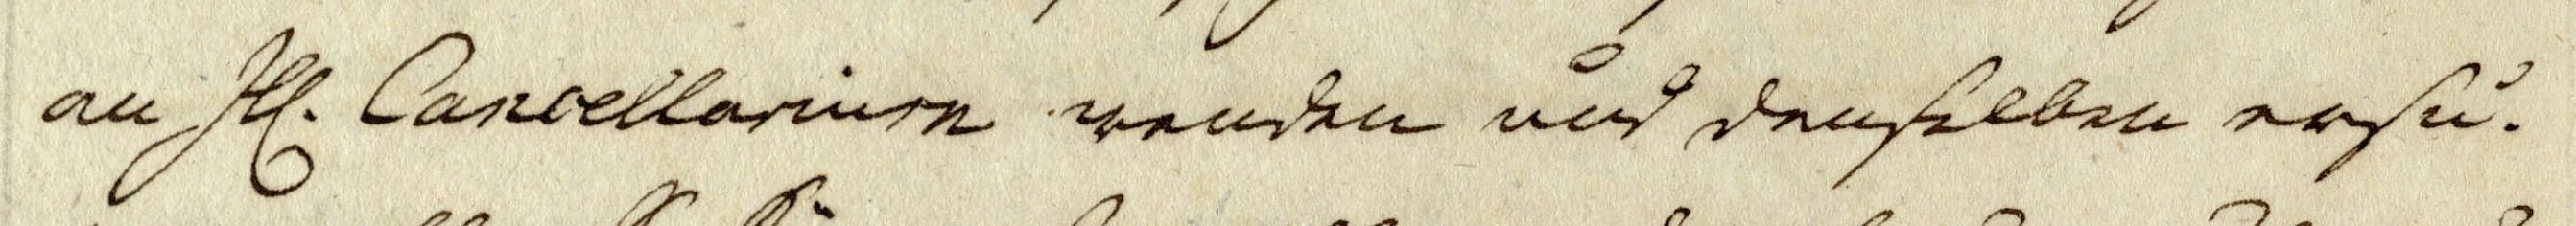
an Ill. Cancellarium wenden und denselben ersu¬
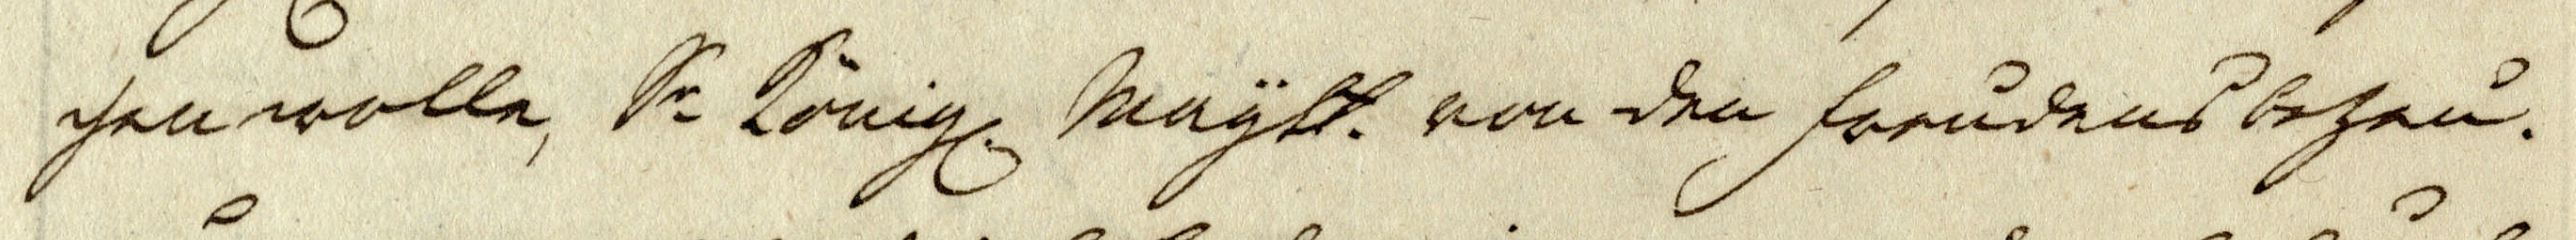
chen wolle, Sr Königl. Maÿtt. von den Freudens bezeu¬
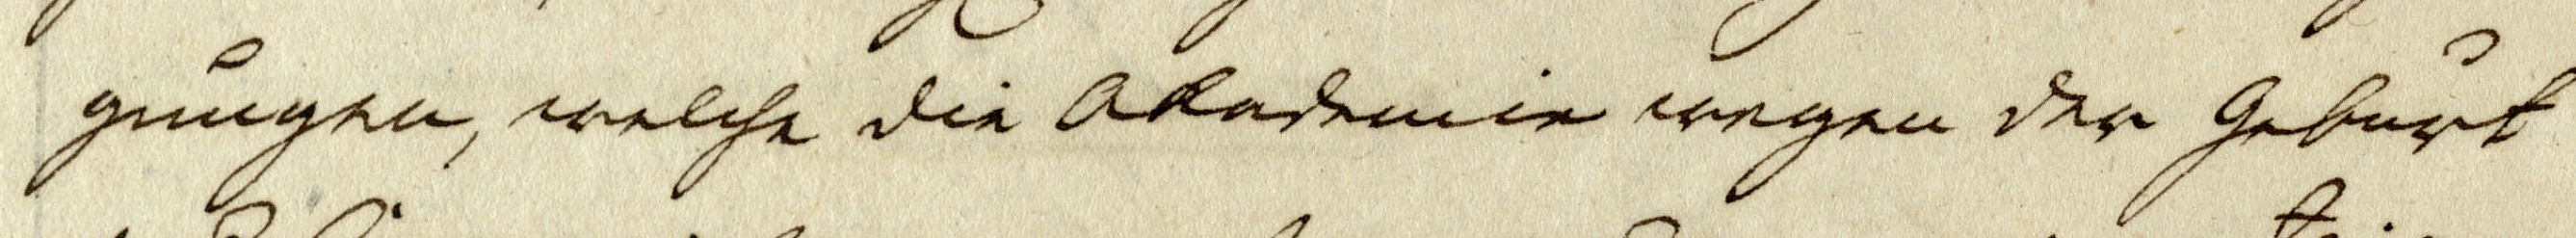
gungen, welche die Akademie wegen der Geburt
